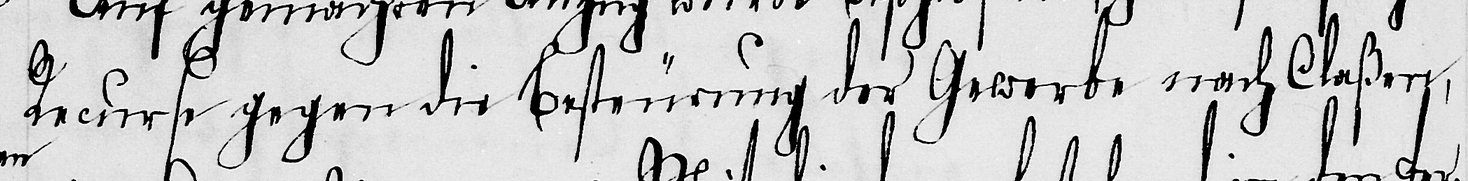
Recurse gegen die Besteuerung der Gewerbe nach Claßen,
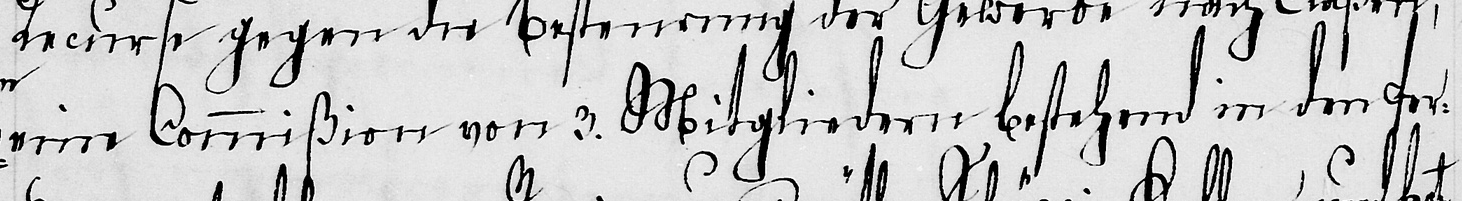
eine Commißion von 3. Mitgliedern bestehend in den Per¬
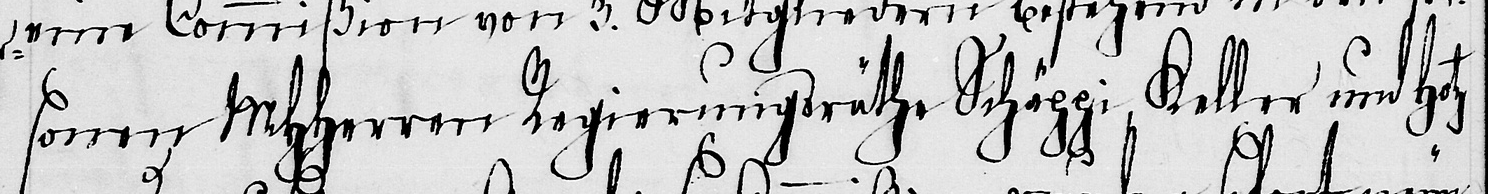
sonen MHHerren Regierungsräthe Schäppi, Keller und Ho¬
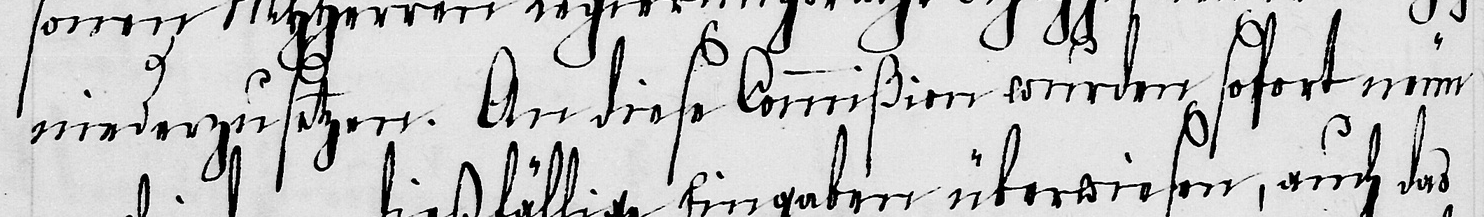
niederzusetzen. An diese Commißion wurden sofort neun
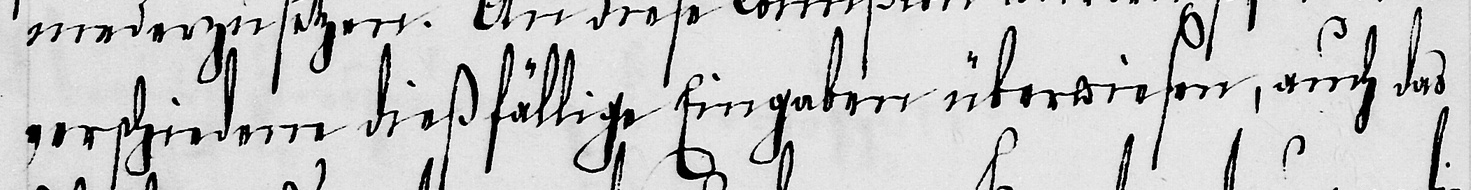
verschiedene dießfällige Eingaben überwiesen, auch das
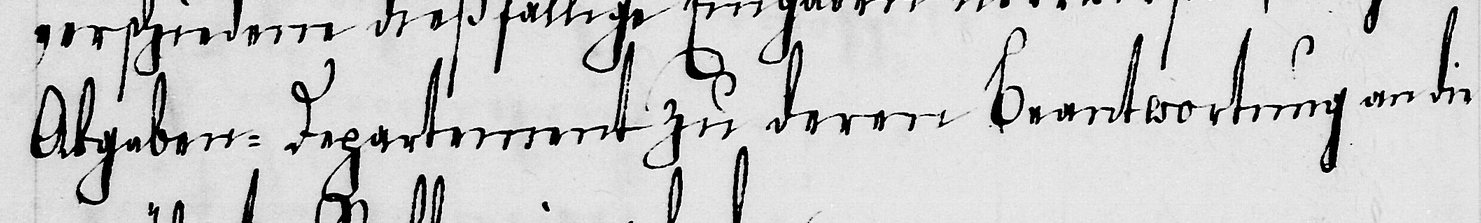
Abgaben-Departement zu deren Beantwortung an die
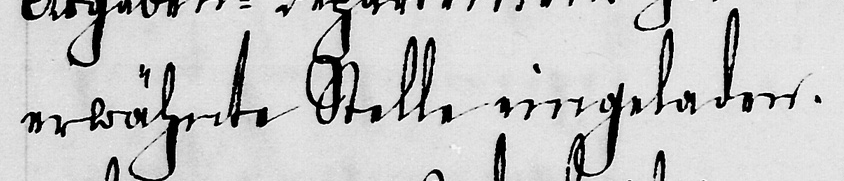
erwähnte Stelle eingeladen.
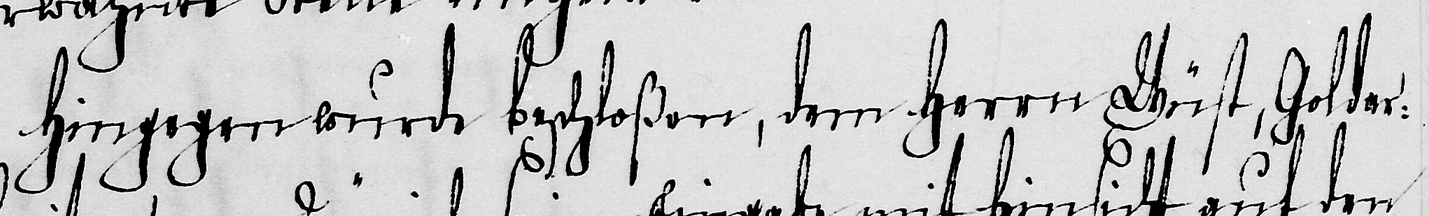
Hingegen wurde beschloßen, dem Herrn Wüst, Goldar¬
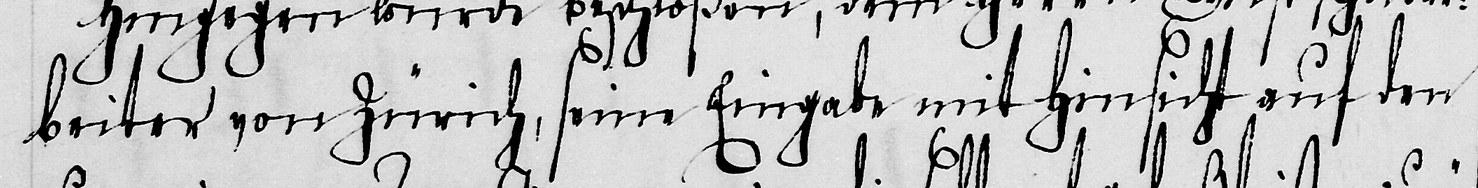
beiter von Zürich, seine Eingabe mit Hinsicht auf den
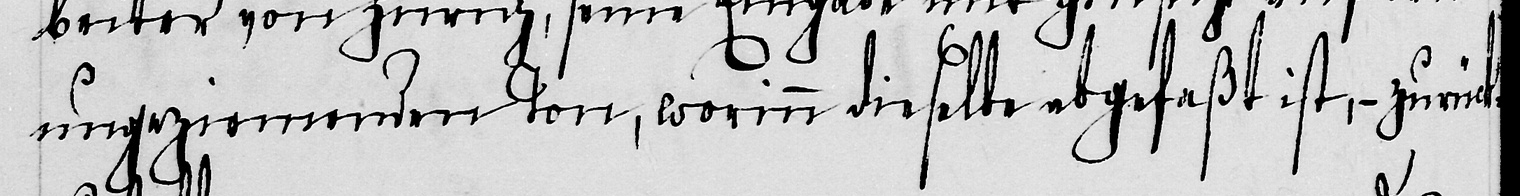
ungeziemenden Ton, worin dieselbe abgefaßt ist, – zur¬
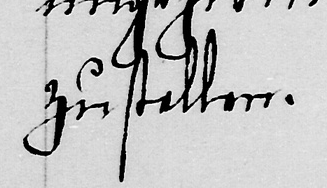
zustelle¬
